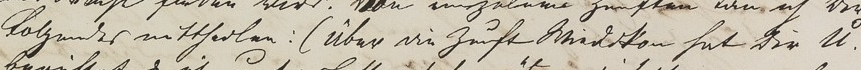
folgendes mittheilen: (Über die Zunft Wiedikon hat Dir U.
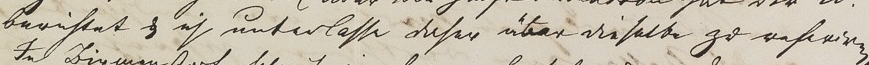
berichtet & ich unterlasse daher über dieselbe zu referiren.)
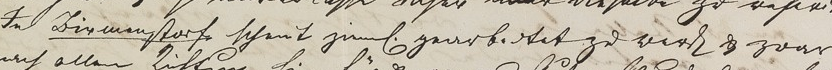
In Birmenstorf scheint zieml. gearbeitet zu werden & zwar
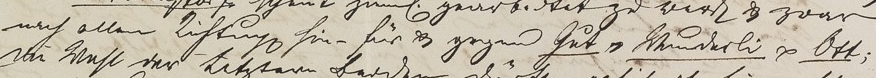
nach allen Richtungen hin ­ für & gegen Gut u Wunderli & Ott;
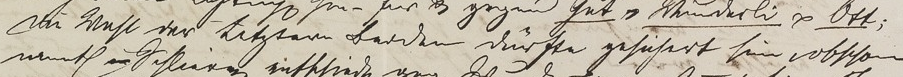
Die Wahl der Letztern Beiden dürfte gesichert sein, obschon
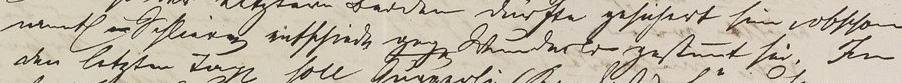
namentlich Schlieren entschieden gegenWunderli gestimmt sei. In
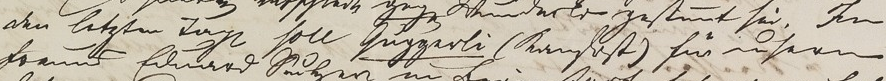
den letzten Tagen soll Guggerli (Kanzlist) für unsern
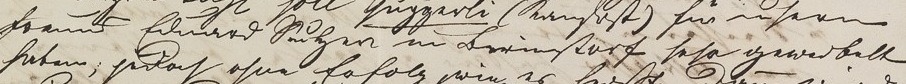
Freund Eduard Sulzer in Birmenstorf sehr geweibelt
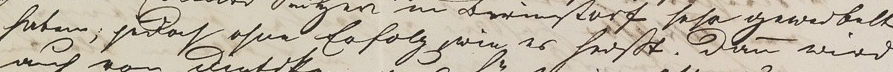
haben; jedoch ohne Erfolg, wie es heißt. Dann wird
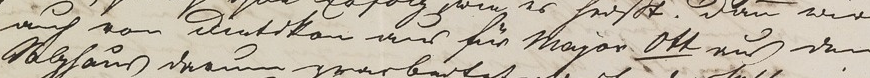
auch von Dietikon aus für Major Ott aus dem
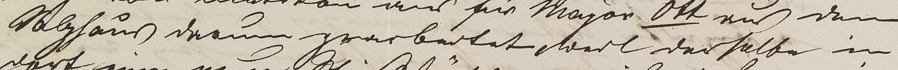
Salzhaus darum gearbeitet, weil derselbe in
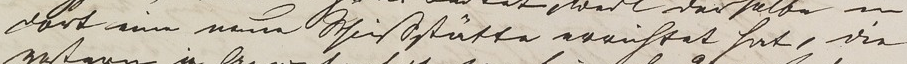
dort eine neue Schießstätte errichtet hat, die
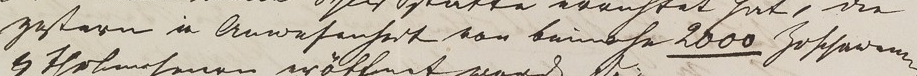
gestern in Anwesenheit von beinahe 2000 Zuschauern
